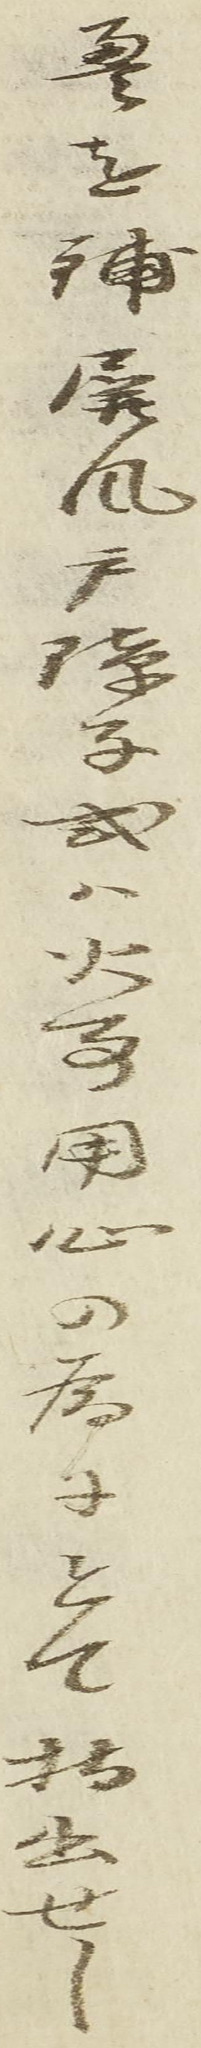畳を鋪屏風戸障子或ハ火事用心の為にとて持出せし

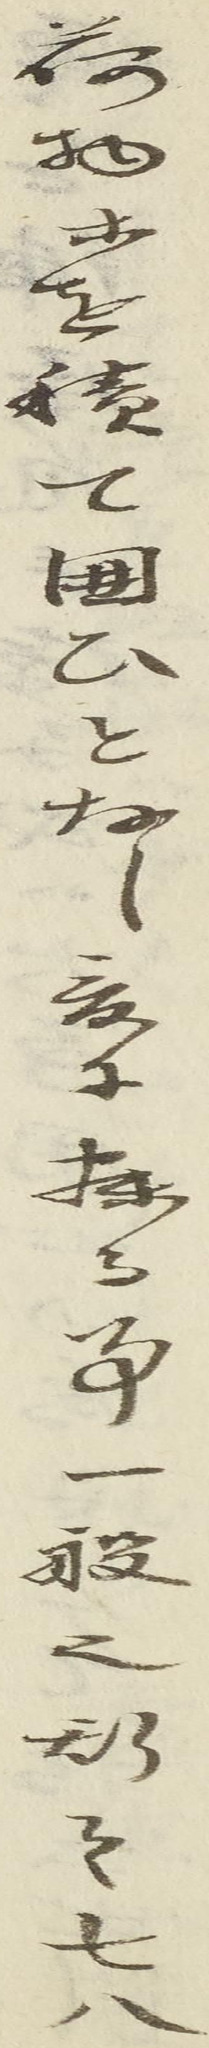荷物等を積て囲ひとなし爰に寝る事一般也斯て七八
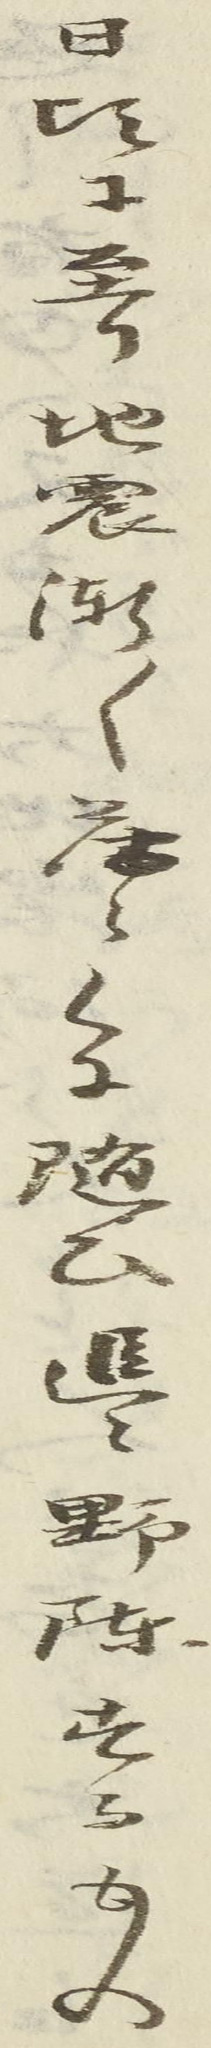日頃に至り地震漸〳〵薄らくに随ひ追々野陣するもの
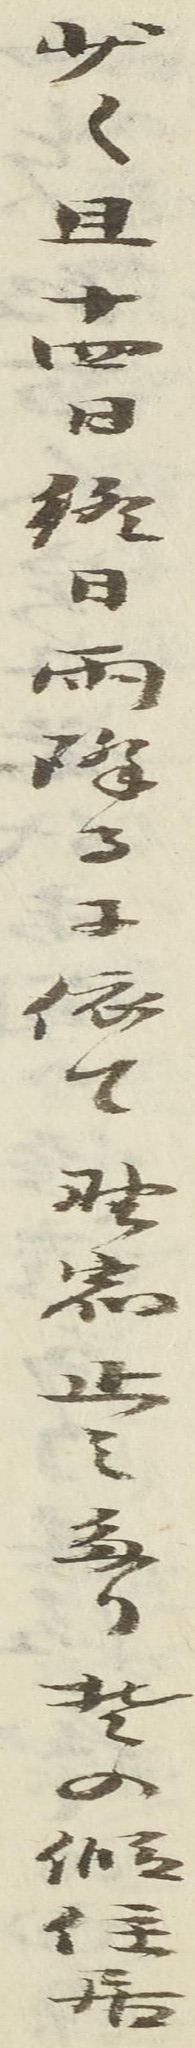少く且十四日終日雨降るに依て野宿止ミたりその假住居
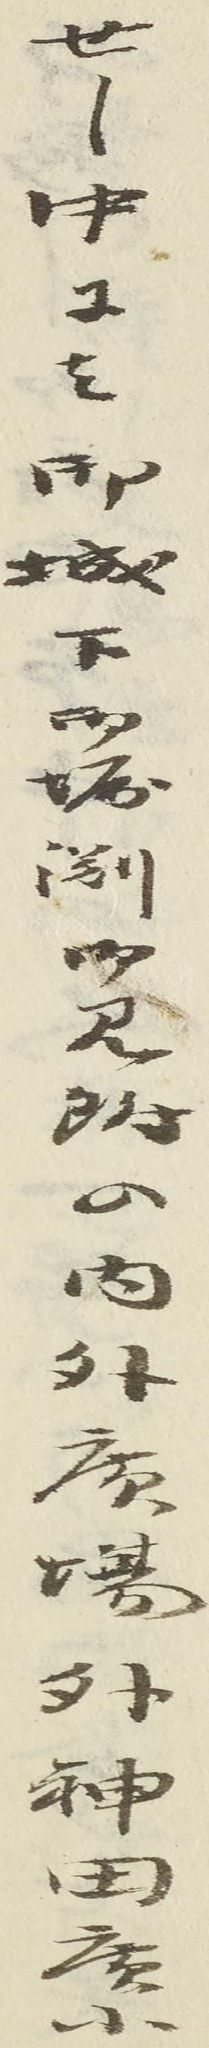せし中には御城下御堀淵御見附の内外広場外神田広小
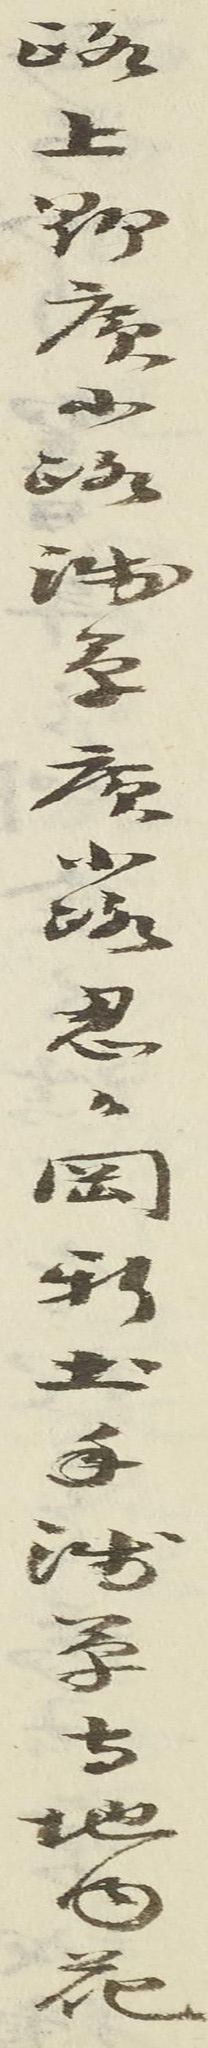路上野広小路浅草広小路忍か岡新土手浅草寺地内花
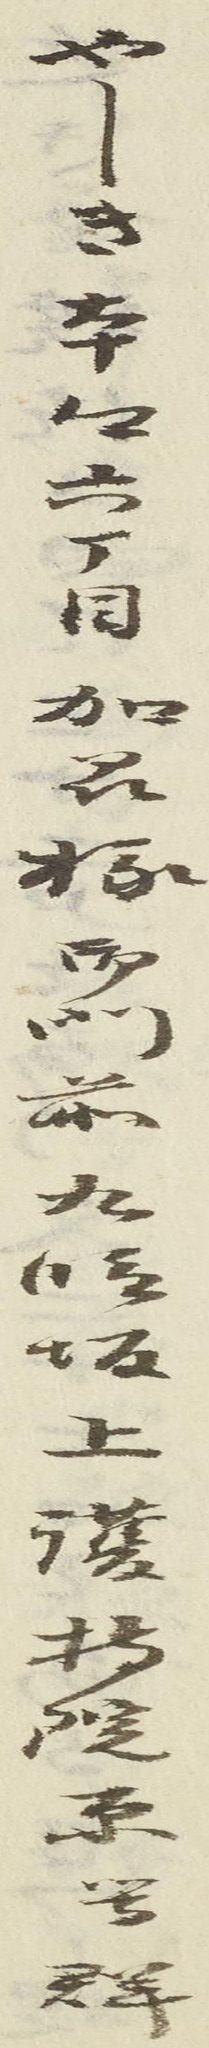やしき本郷六丁目加藤様御門前九段坂上護寺院原等群
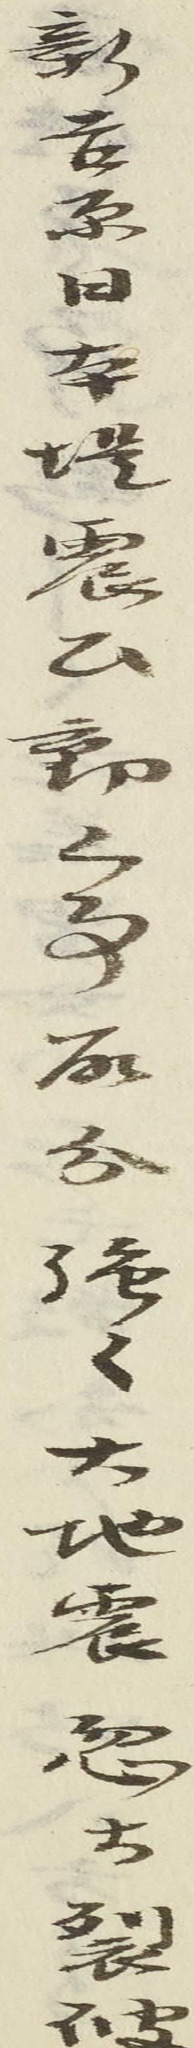新吉原日本堤震ひ動く事取分強く大地震忽ち烈裂破
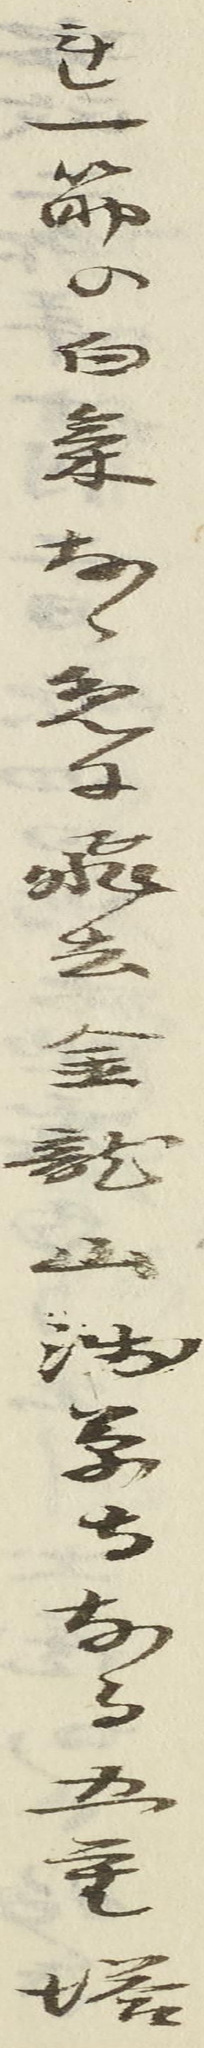れ一筋の白気なゝめに飛去金龍山浅草寺なる五重搭
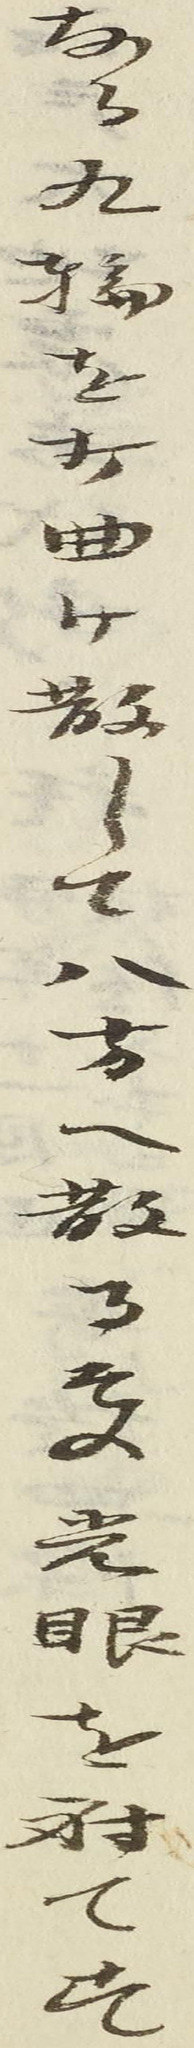なる九輪を打曲ヶ散して八方へ散るその光眼を射てす
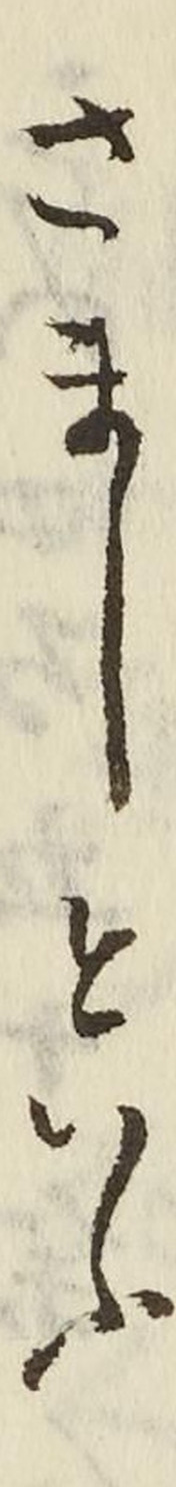さましといふ
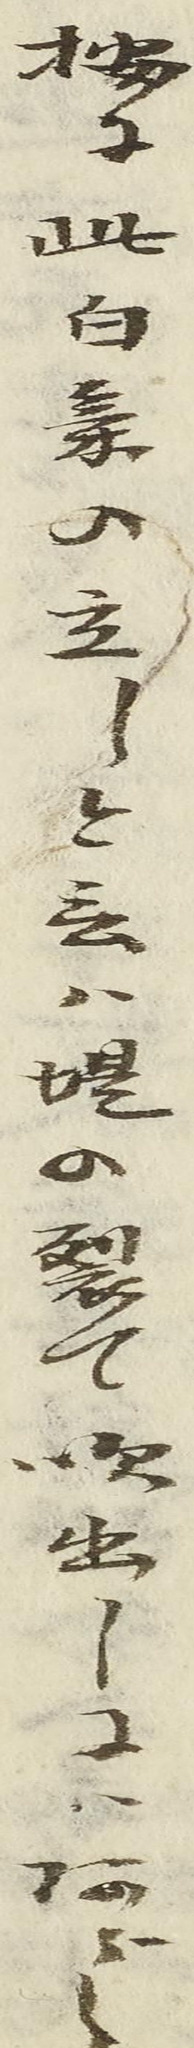按に此白気の立しと云破堤の裂て吹出しに派あらし
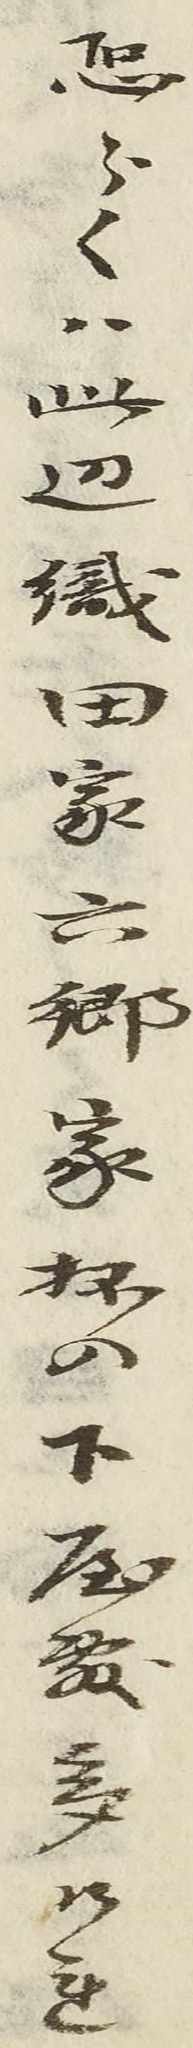恐らく破此辺織田家六郷家抔の下屋敷多けれ
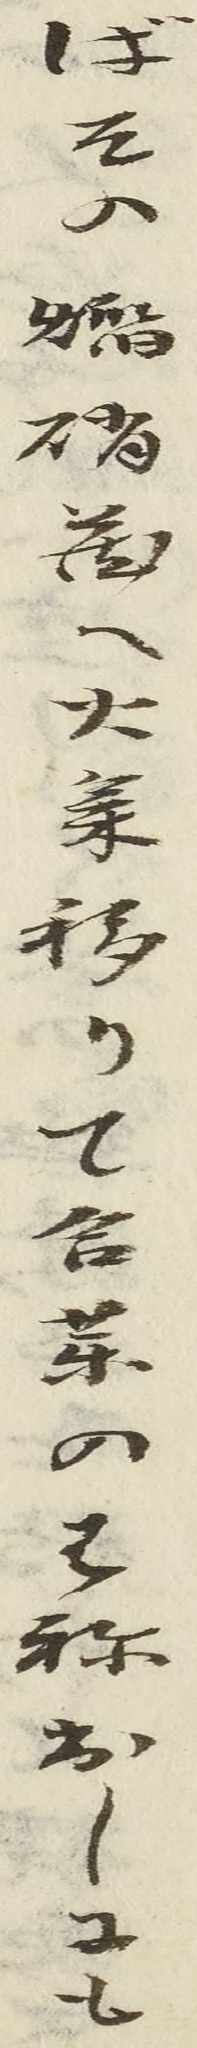ばその焔硝蔵へ火気移りて合薬のはねしにも
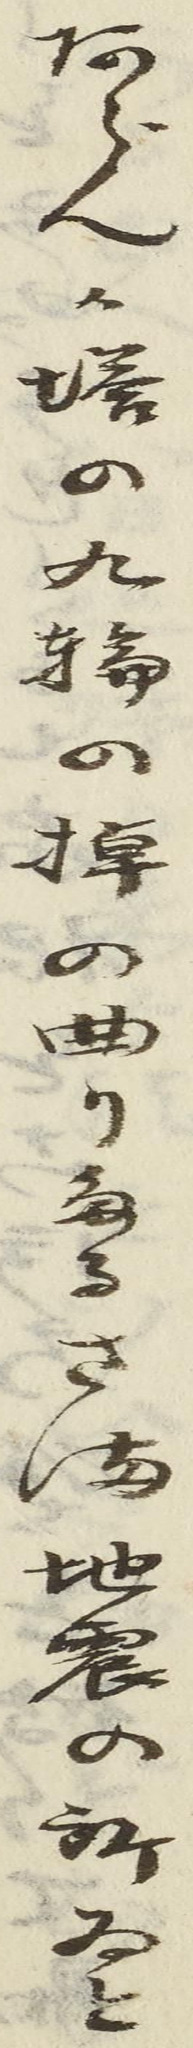あらんか搭の九輪の棹の曲りたるさま地震の所ゐと
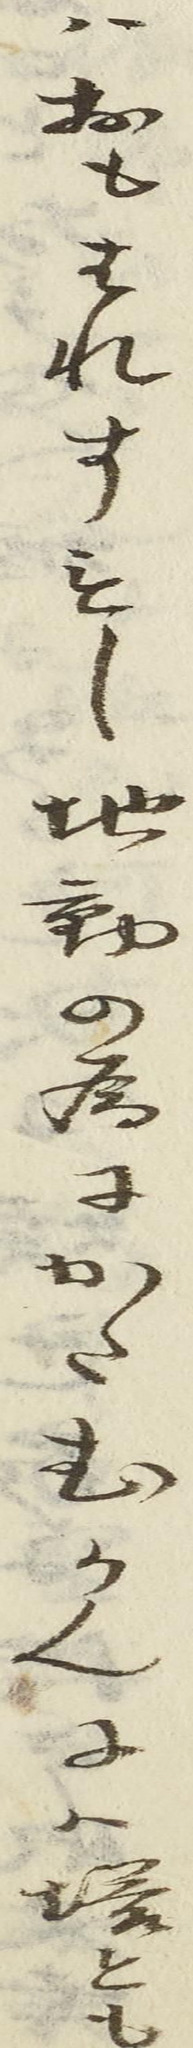ハおもはれすもし地震の為にかたむかんにハ搭とも
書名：那為の後見艸　全
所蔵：東京大学地震研究所図書室 Earthquake Research Institute Library, The University of Tokyo, JAPAN
